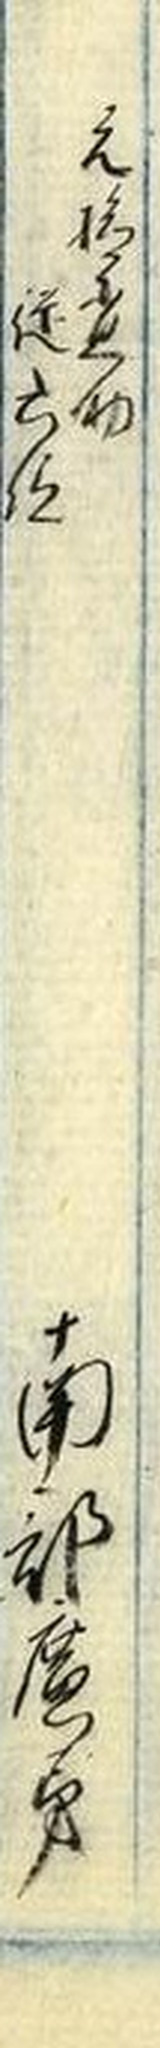従六位南部広矛
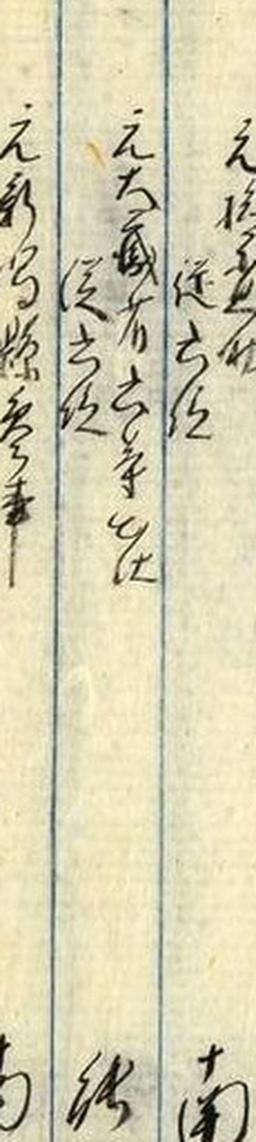元大蔵省六等出仕
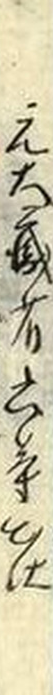元大蔵省六等出仕
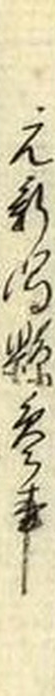元新潟県参事
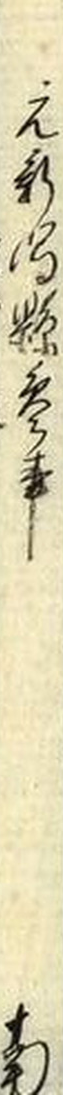元新潟県参事

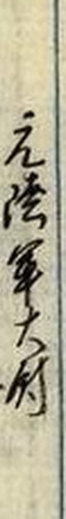元陸軍大尉
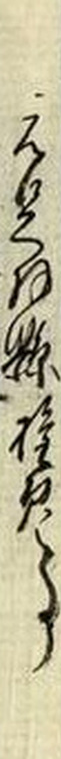元足羽県権参事
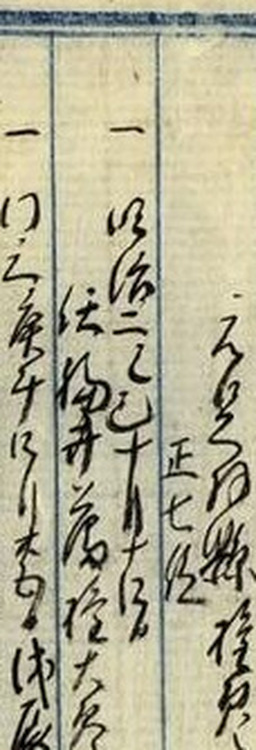一明治二己巳十月十四日
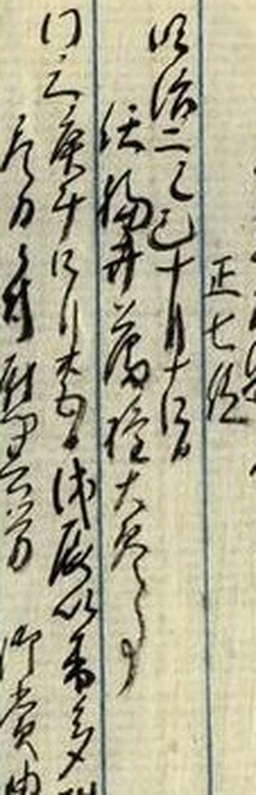任福井藩権大参事
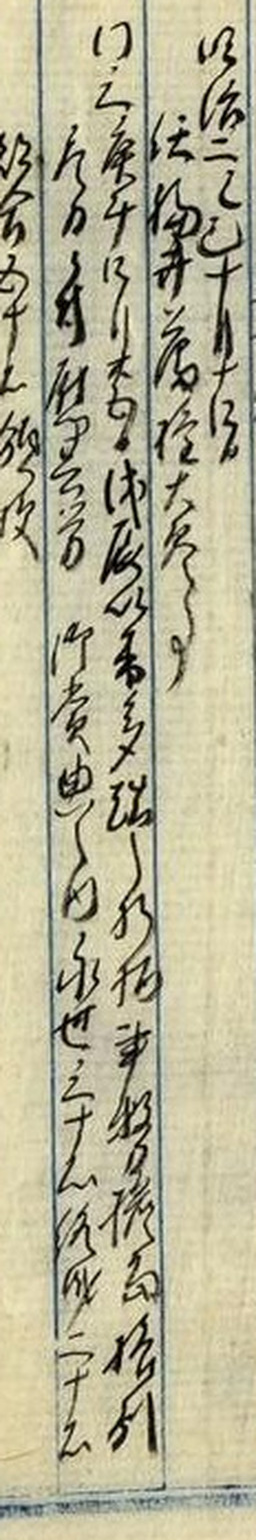一同三庚午四月廿五日戊辰以来多端之折柄事務担当格別
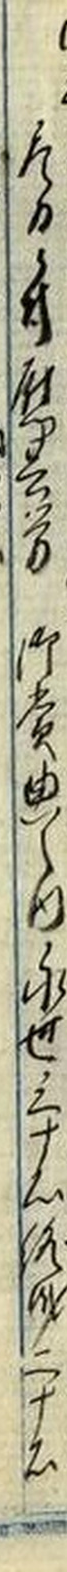尽力ニ付慰労御賞典之内永世三十石終身二十石
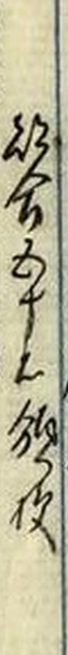都合五十石領授
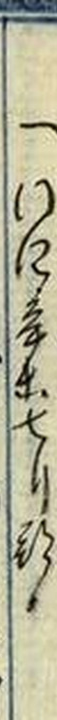一同四辛未七月朔日
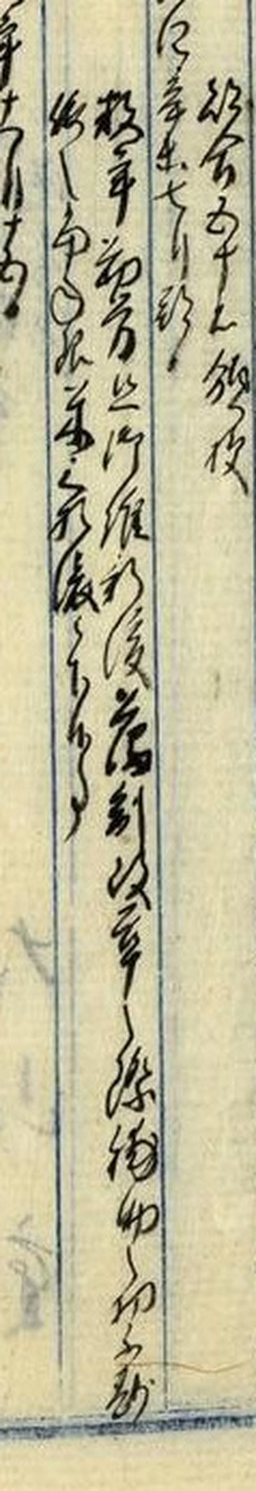数年勤労且御維新後藩制改革之際補助之功不尠
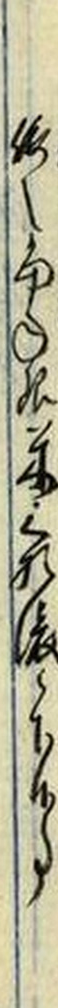依之当年限米三拾俵被下候事
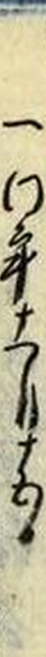一同年十一月十五日
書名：温古集 三巻
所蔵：福井県文書館 Fukui Prefectural Archives
